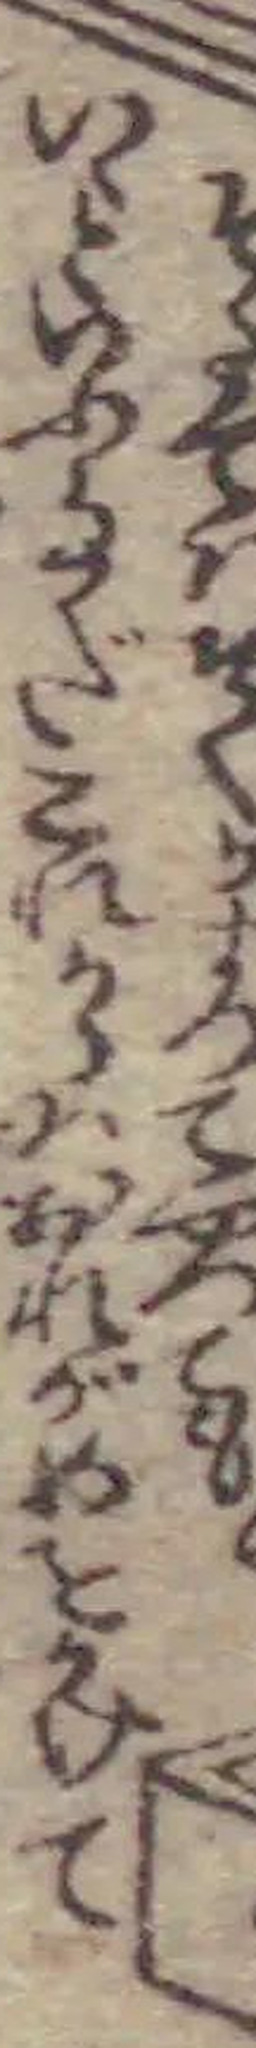いゝといふ事だこれからはおれがめをかけて
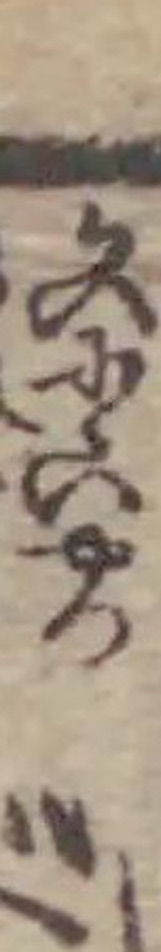かいにくいやつ
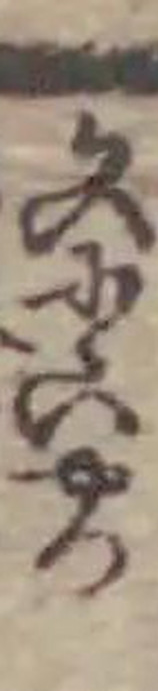かいにくいやつ
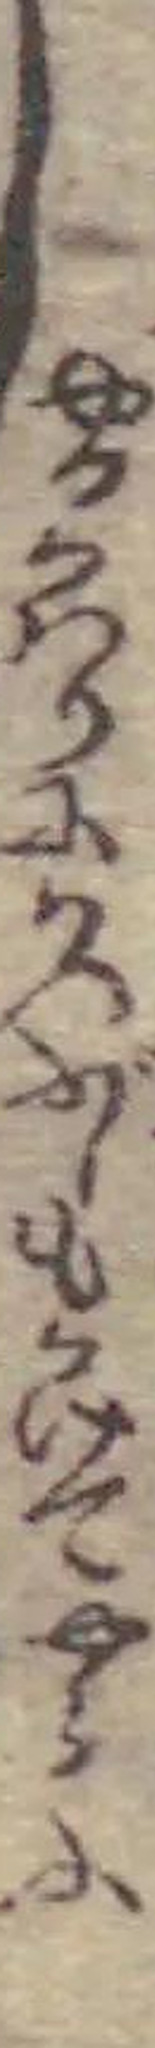やるかはりにかつぶしもかけてやらふ
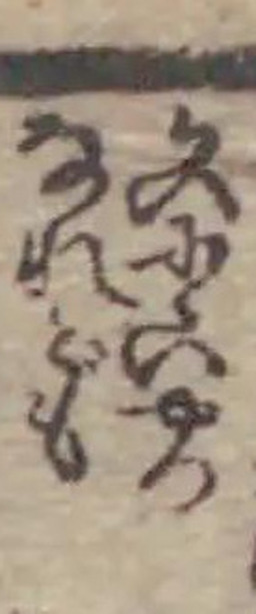なれども
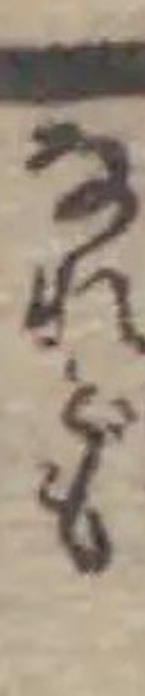なれども
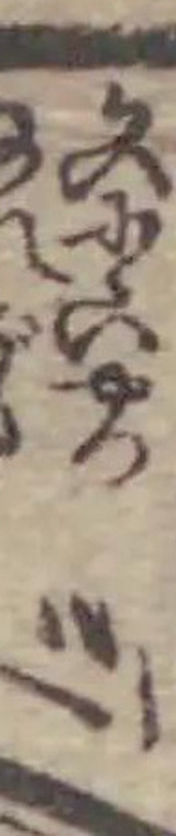かいにくいやつ
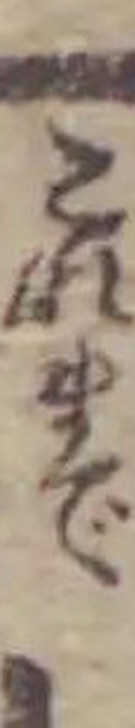これまで
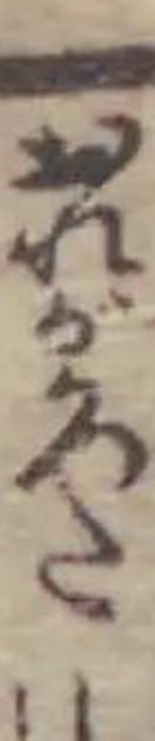おれがかつた
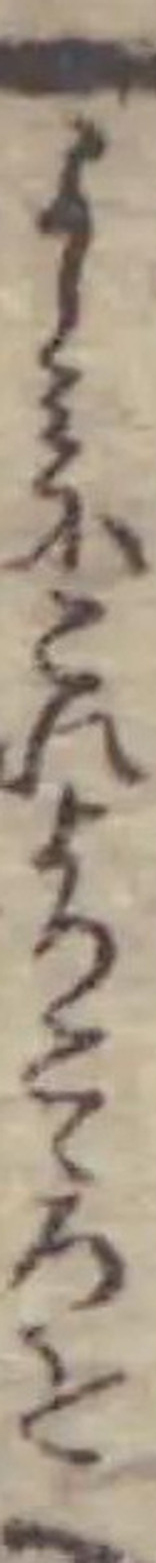よしみにこれよりこゝろを
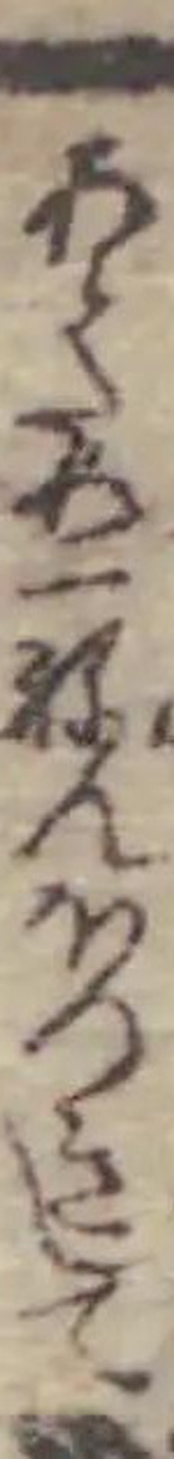あらため一ねんほつきして
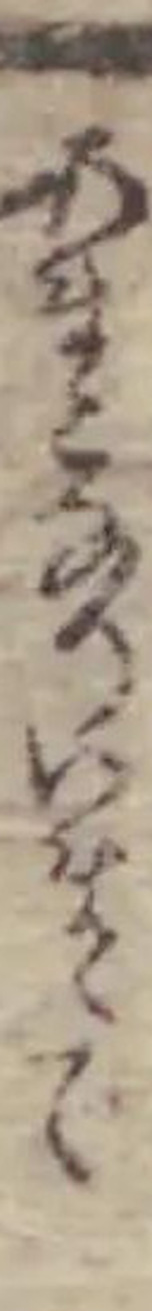あまとなりいまゝで
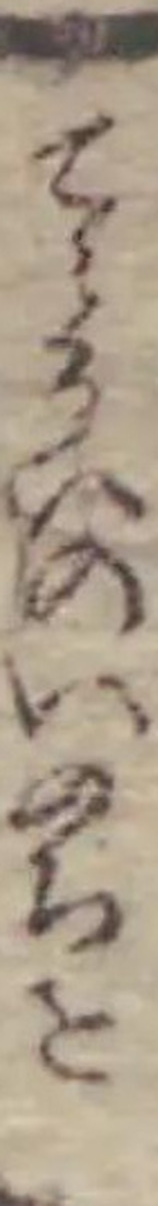てうるいのいのちを
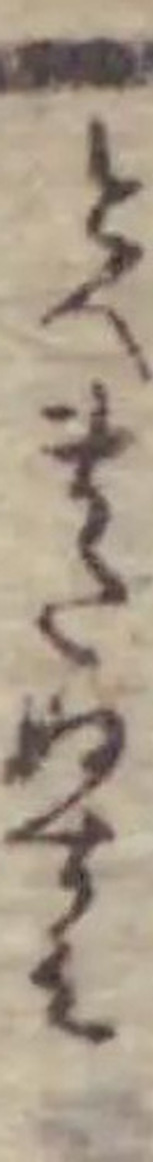とへまたぬすみ
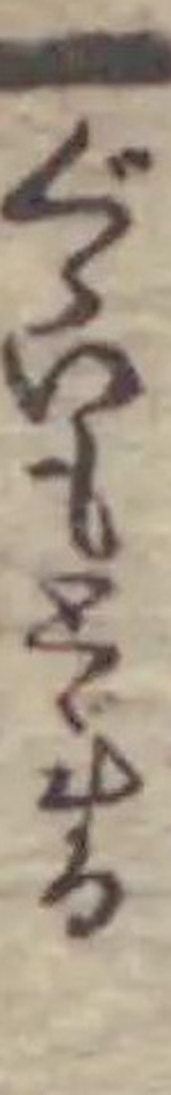ぐらいもとゞまる
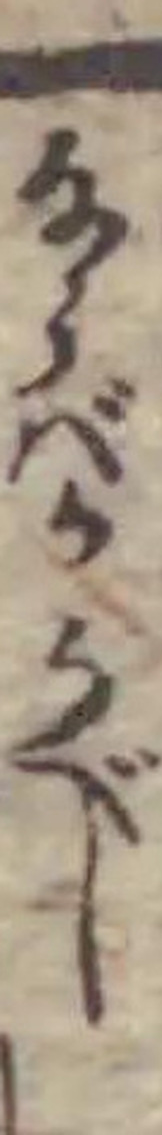ならばかうべし
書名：冷水灰毛猫 2巻
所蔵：国立国会図書館 National Diet Library, JAPAN
